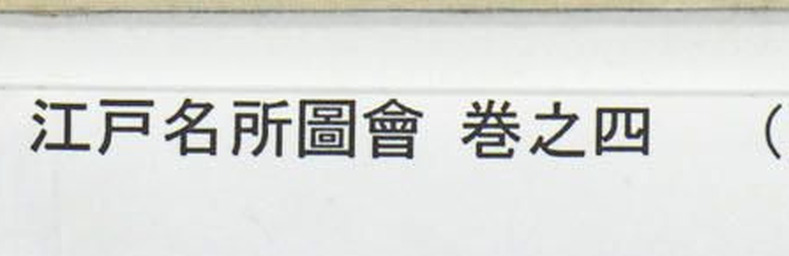江戸名所図会巻之二
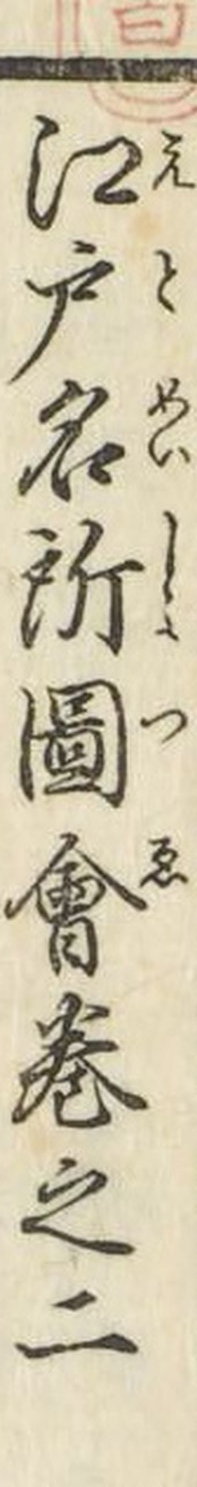江戸名所図会巻之二
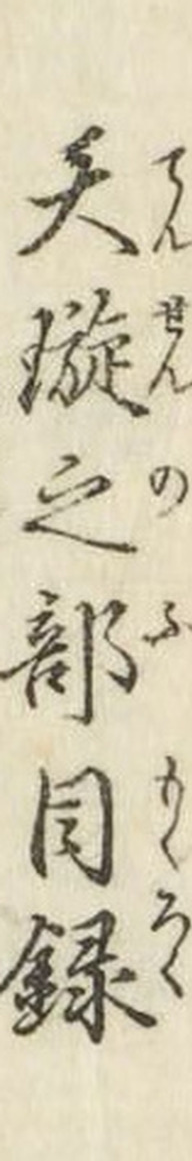天璇之部目録

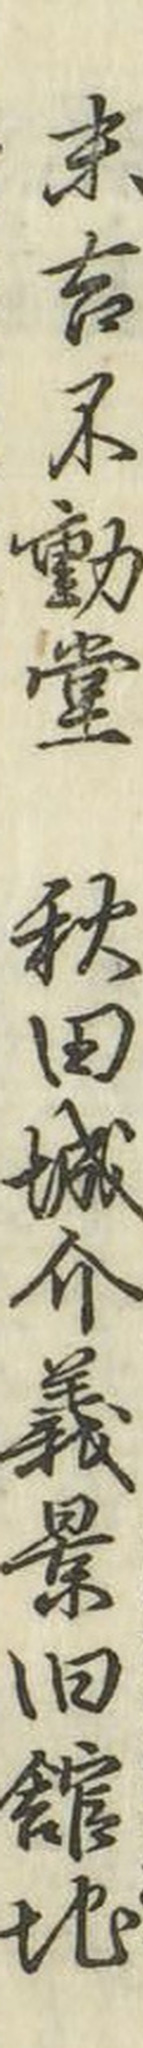末吉不動堂秋田城介義景旧館地成願寺

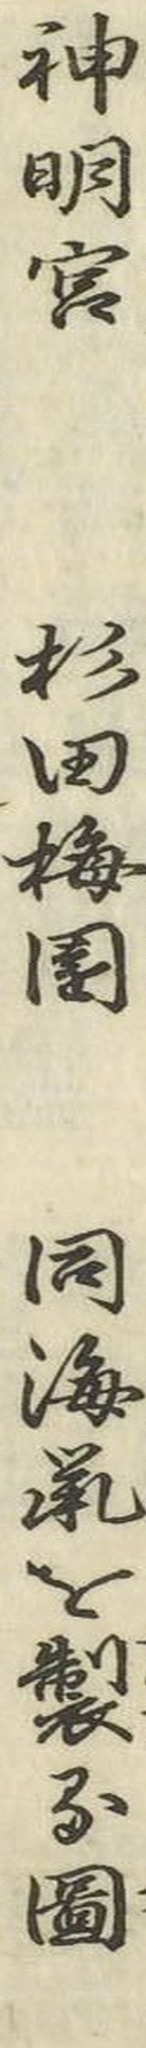神明宮杉田梅園同海鼠を製る図
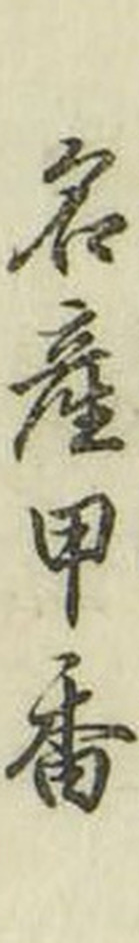名産甲香

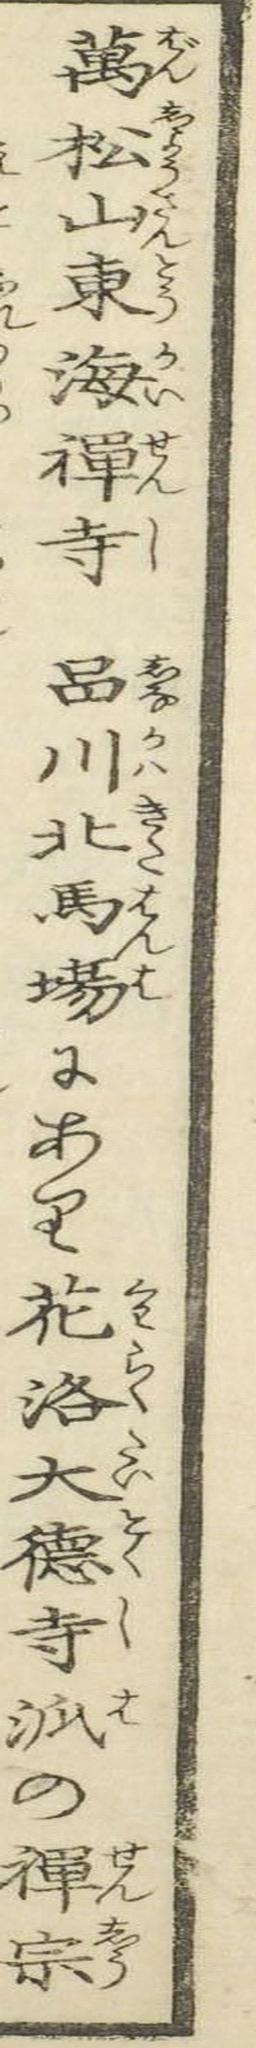萬松山東海禪寺品川北馬塲にあり花洛大德寺派の禪宗
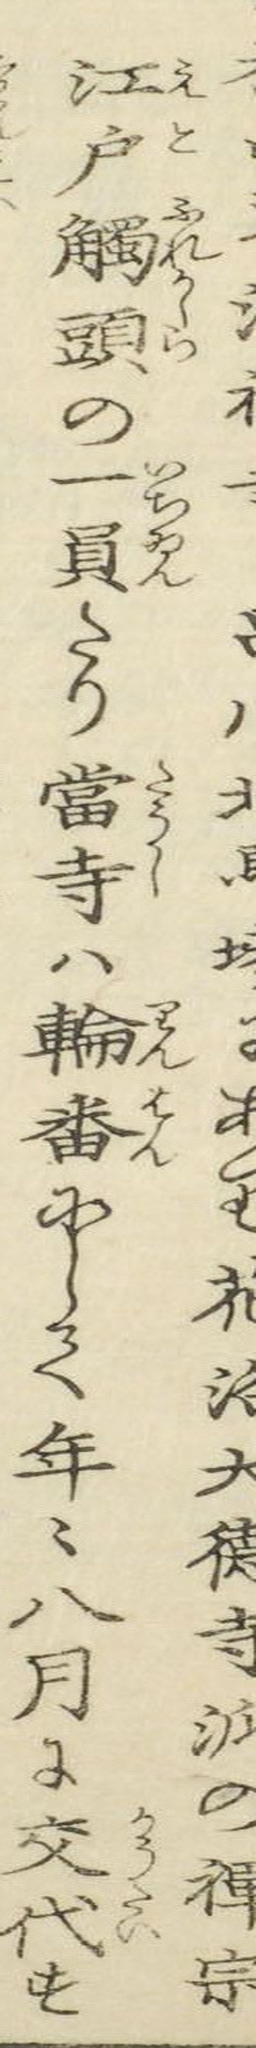江戸觸頭の一員たり當寺は輪番にして年〻八月に交代す
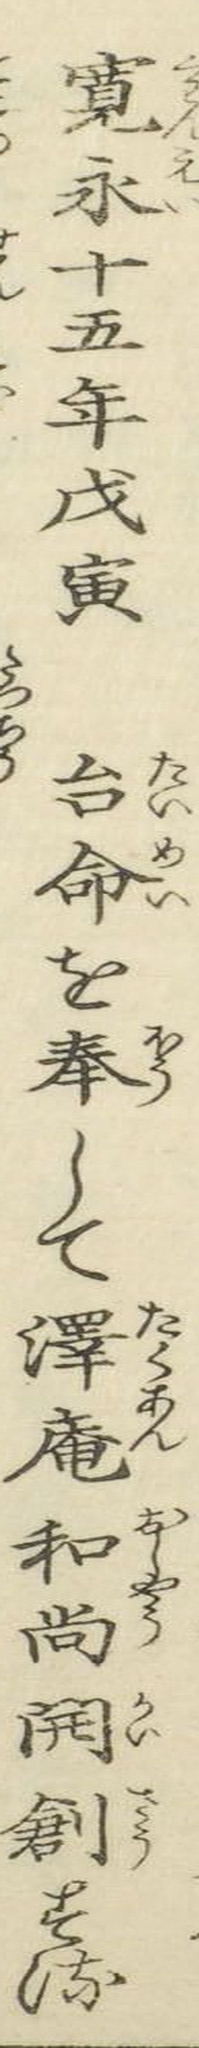寛永十五年戊寅台命を奉して澤庵和尚開創する
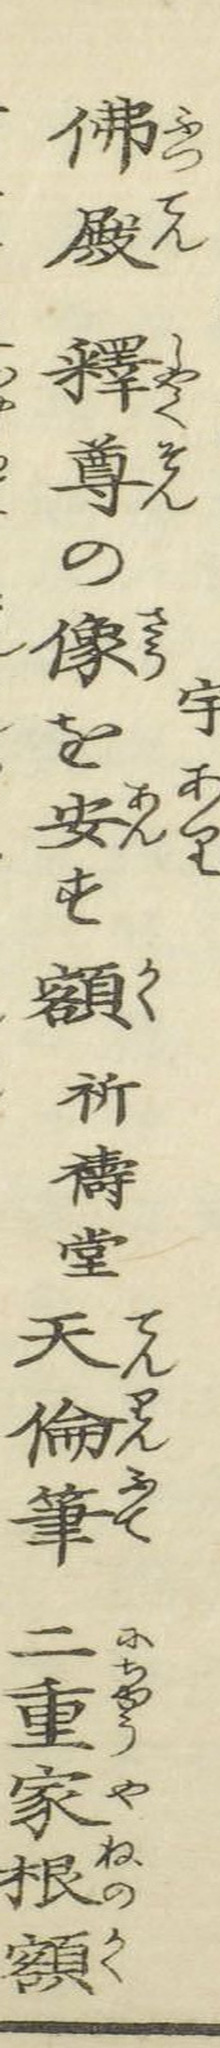佛殿釋尊の像を安す額祈禱堂天倫筆二重屋根額

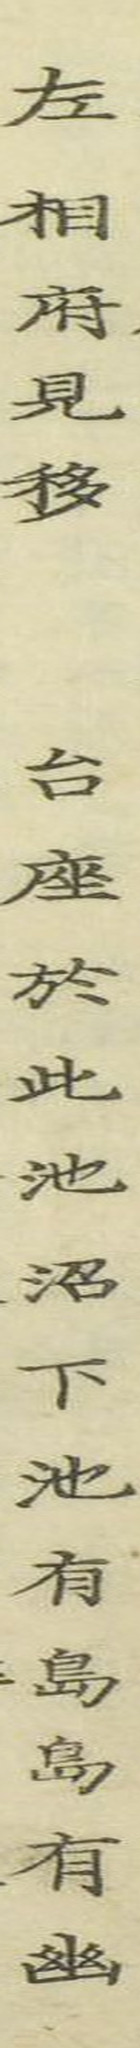左相府見移台座於此池沼下池有島島有幽
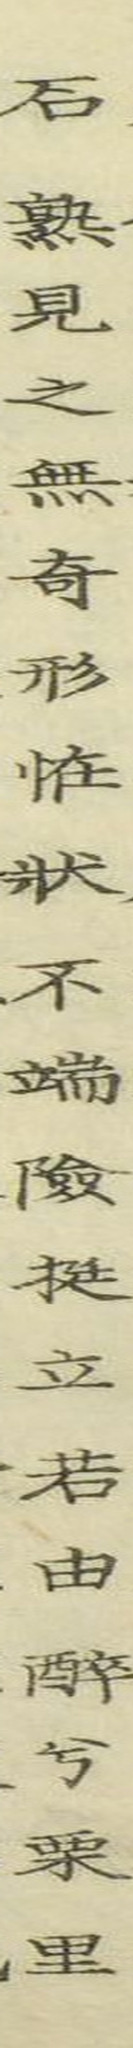䂖熟見之無奇形恠狀不端險挺立若由醉兮栗里
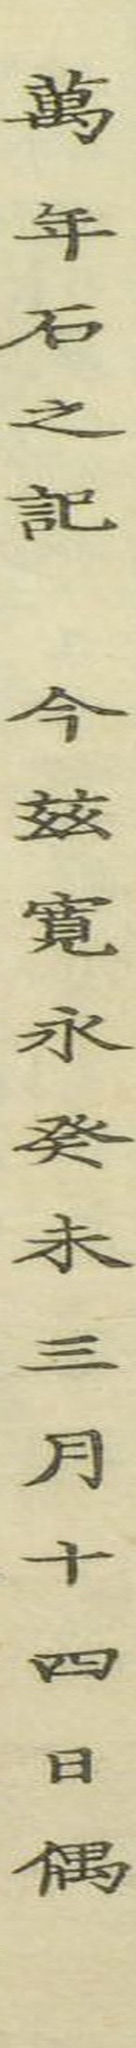萬年石之記今玆寛永癸未三月十四日偶
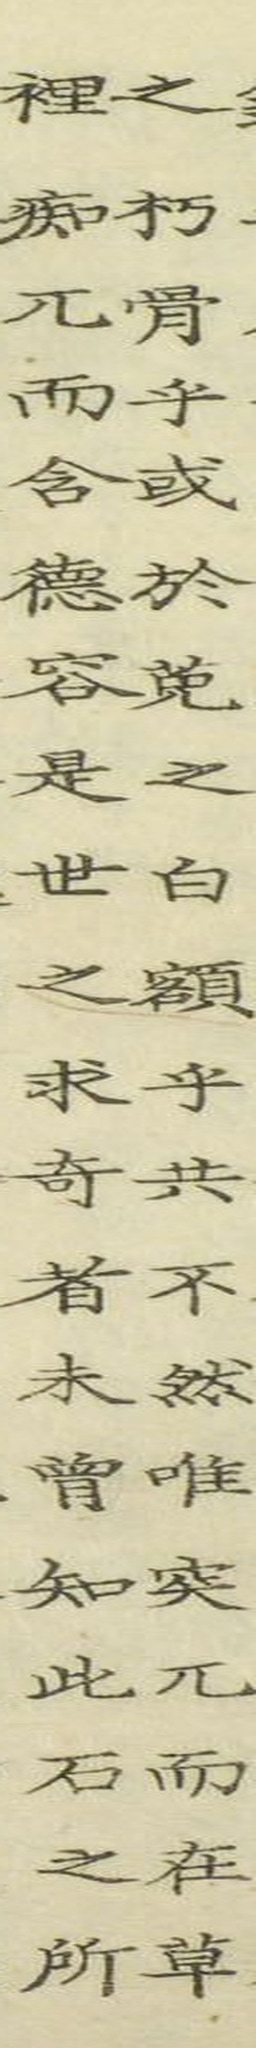裡痴兀而含德容是世之求奇者未曾知此石之所
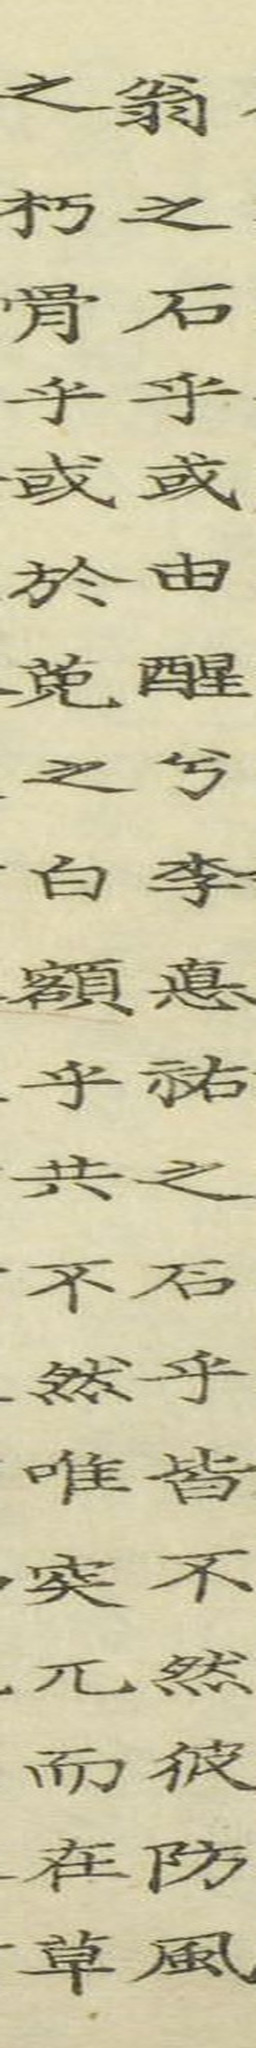之朽骨乎或於莵之白額乎共不然唯突兀而在草
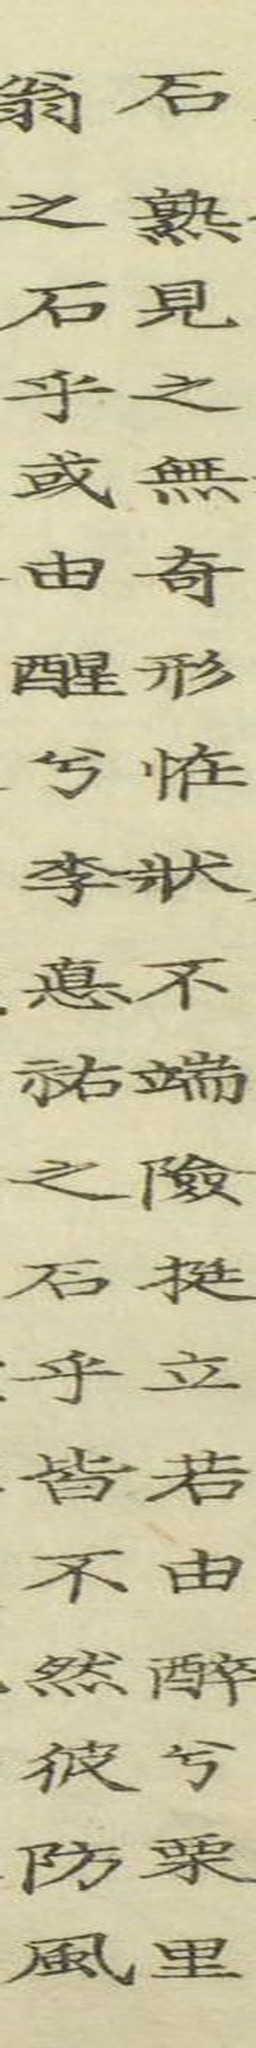翁之石乎或由醒兮李悳祐之䂖乎皆不然彼防風
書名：江戸名所図会 20巻 巻之4
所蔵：東京学芸大学教育コンテンツアーカイブ
